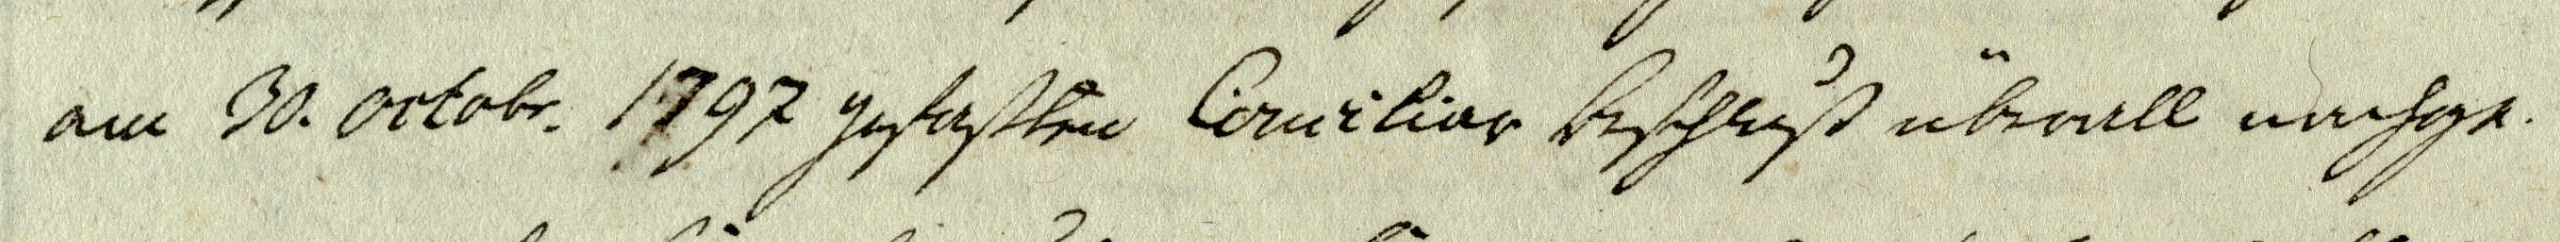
am 30. Octobr. 1797 gefaßten Conciliar Beschluß überall nachge¬
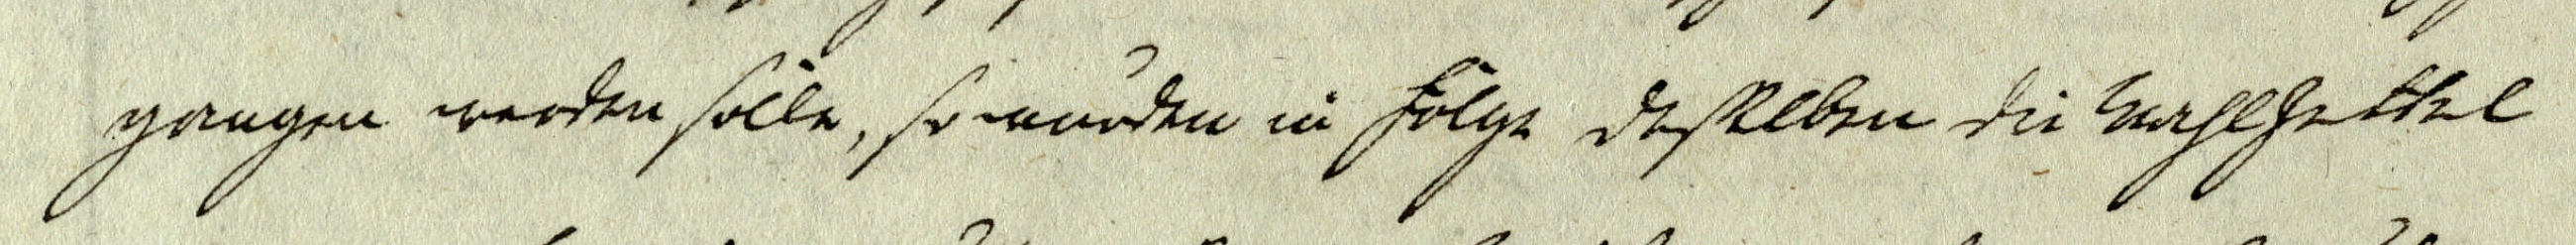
gangen werden solle, so wurden in Folge desselben die Wahlzettel
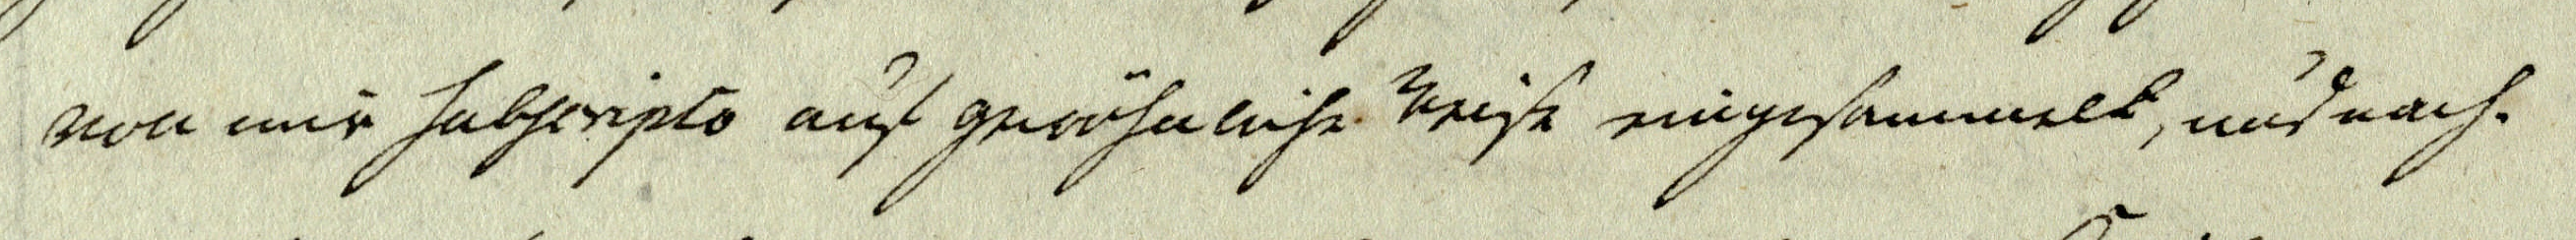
von mir subscripto auf gewöhnliche Weise eingesammelt, und nach¬
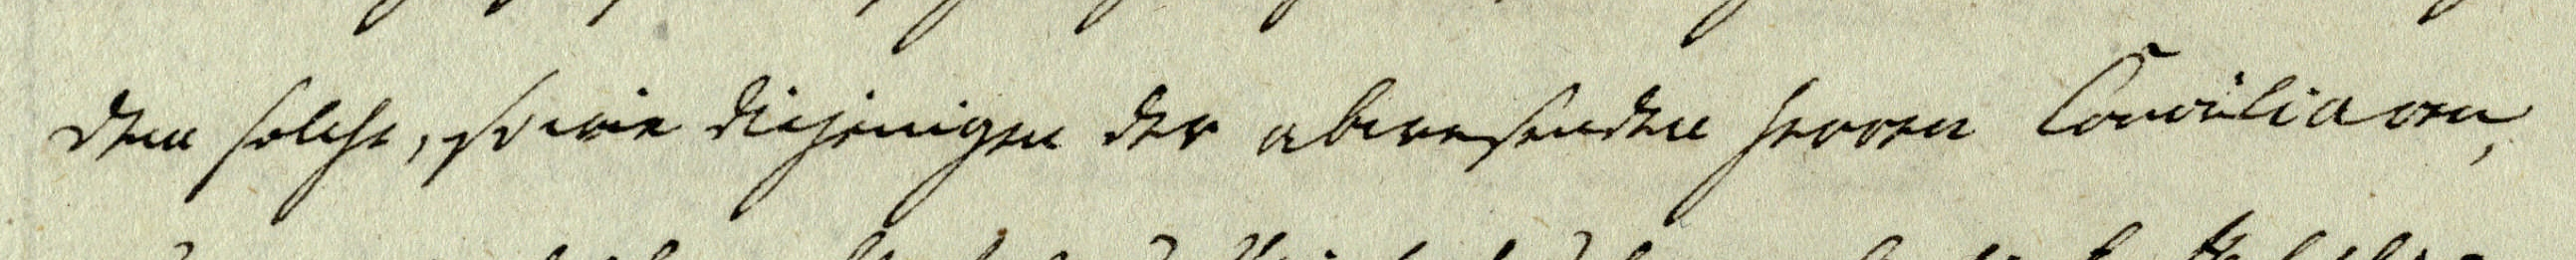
dem solche, so wie diejenigen der abwesenden Herren Conciliaren,
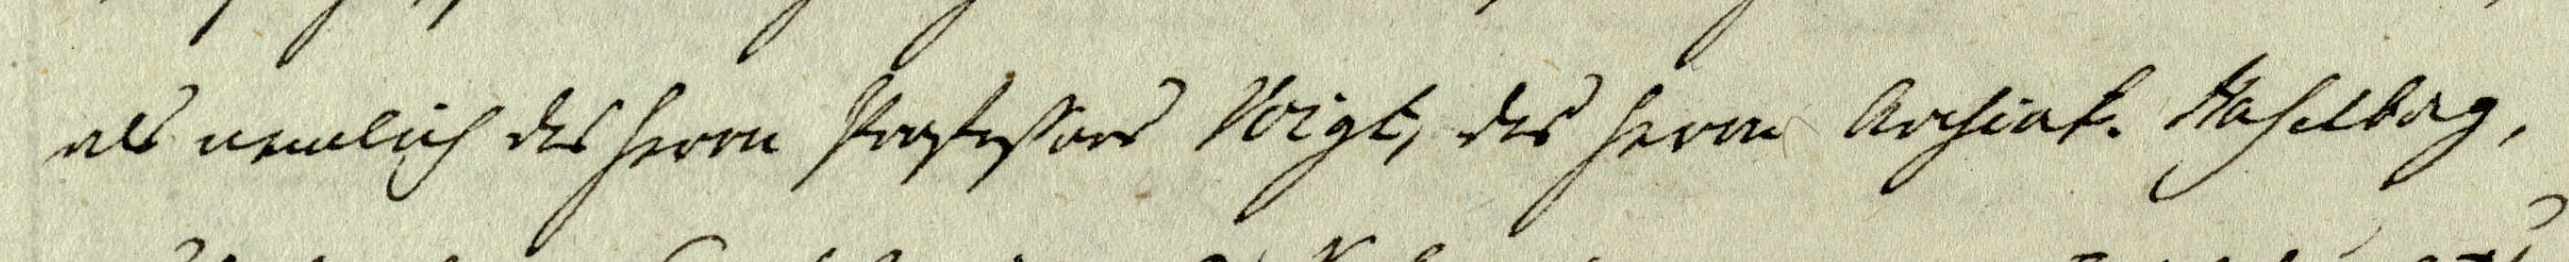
als nemlich des Herrn Professor Voigt, des Herrn Archiat. Haselberg,
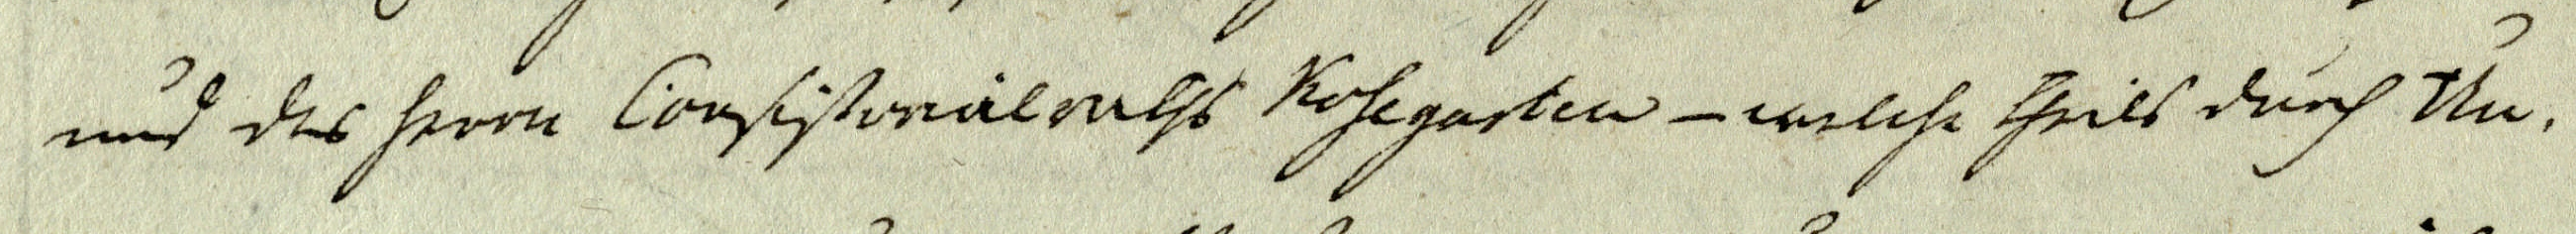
und des Herrn Consistorialraths Kosegarten welche theils durch Un¬
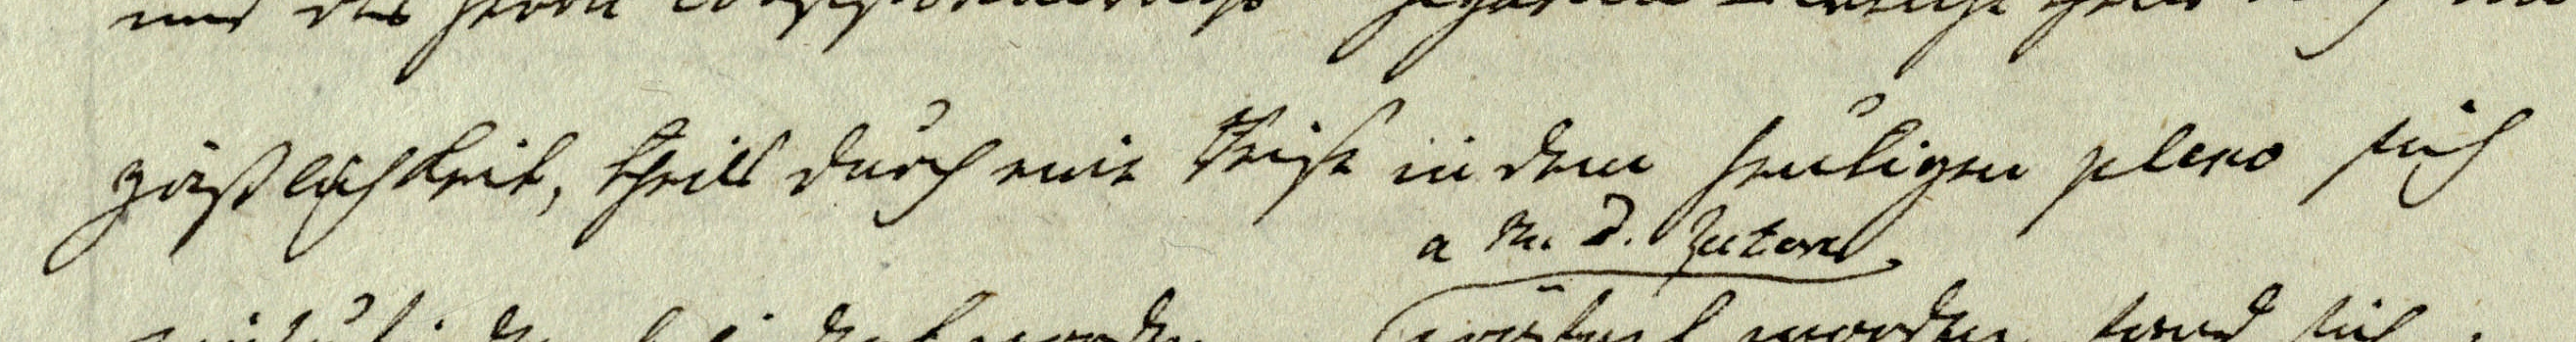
päßlichkeit, theils durch eine Reise in dem heutigen pleno sich
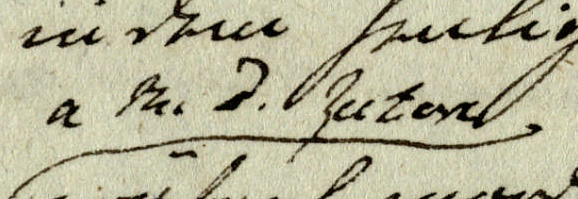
a M. d. Rectore
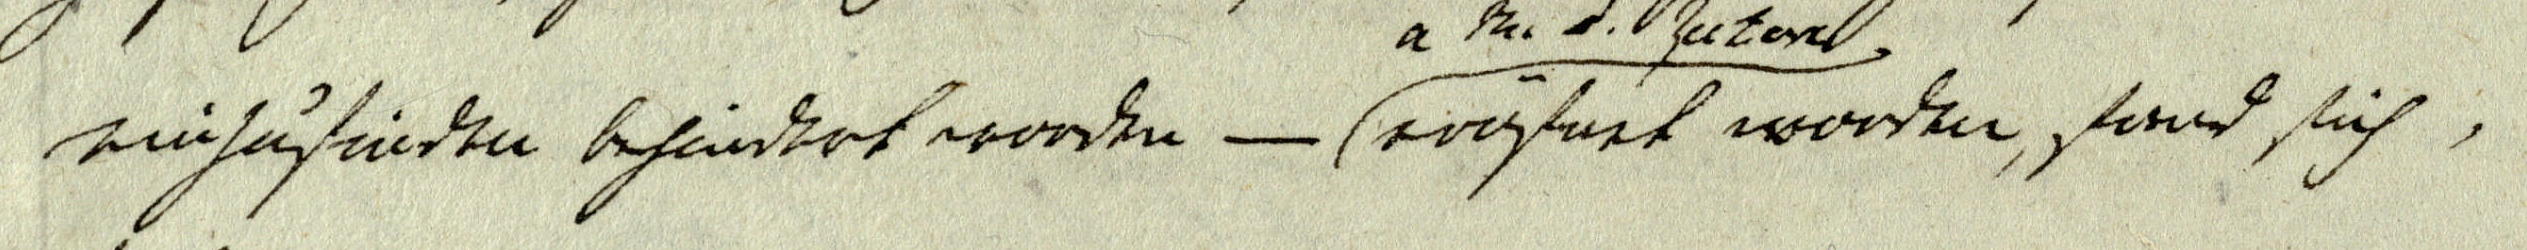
einzufinden behindert worden eröfnet worden, fand sich,
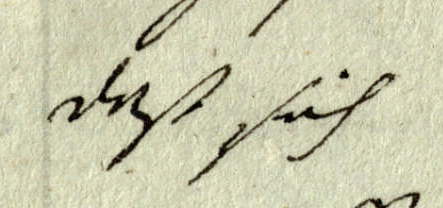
daß sich
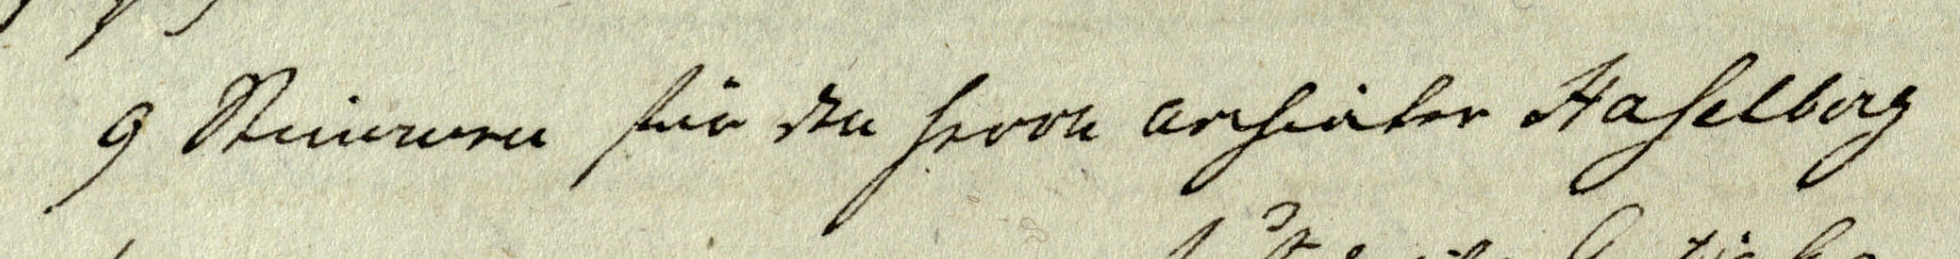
9 Stimmen für den Herrn Archiater Haselberg
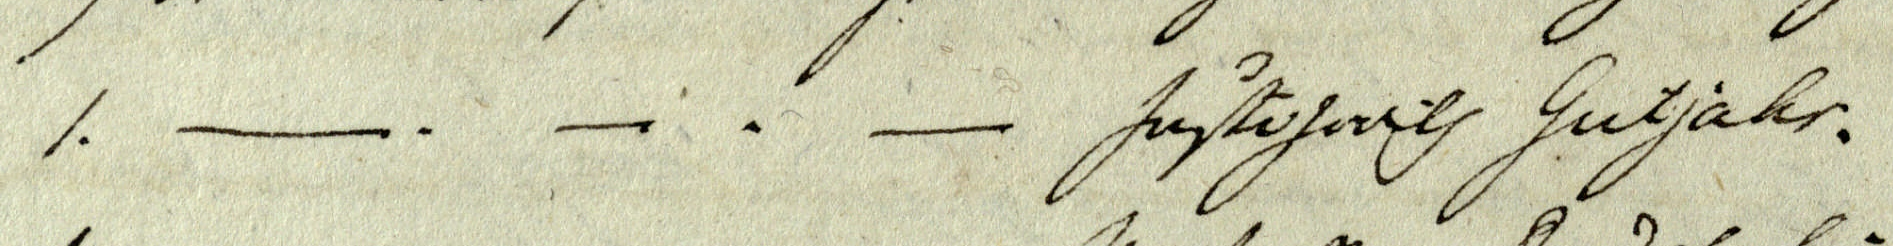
1. Justizrath Gutjahr.
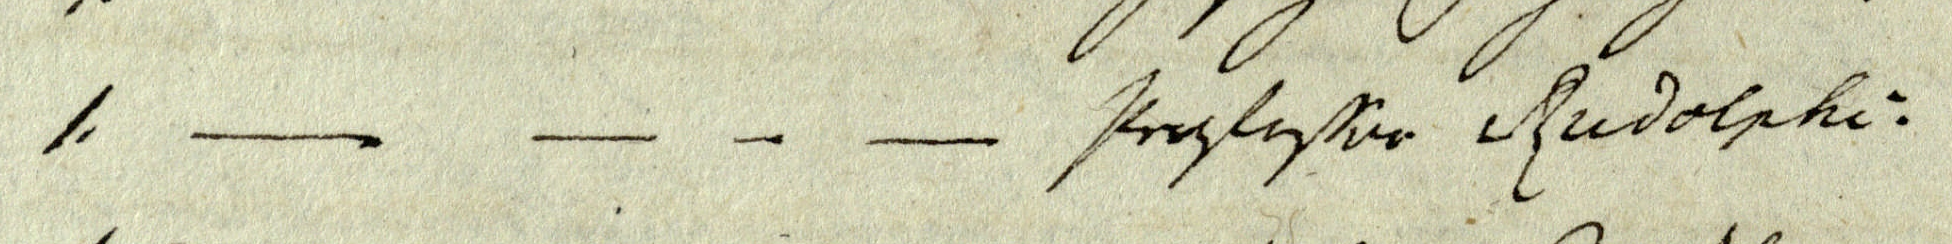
1. Professor Rudolphi¬
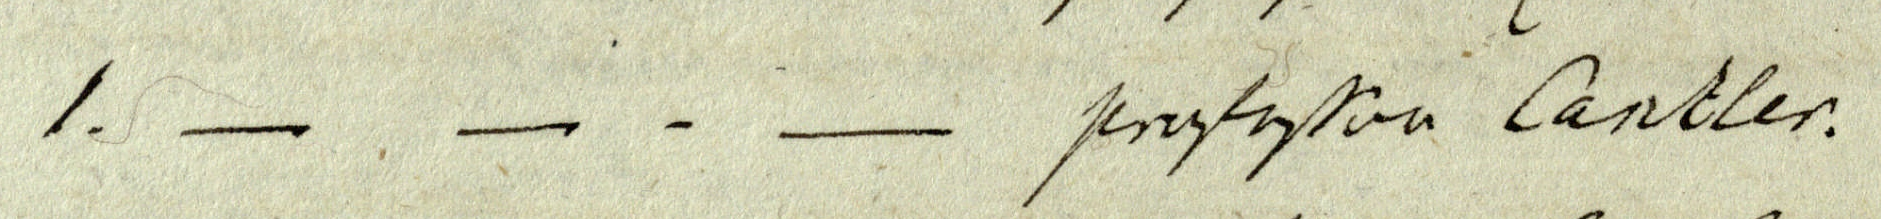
1. Professor Canzler.
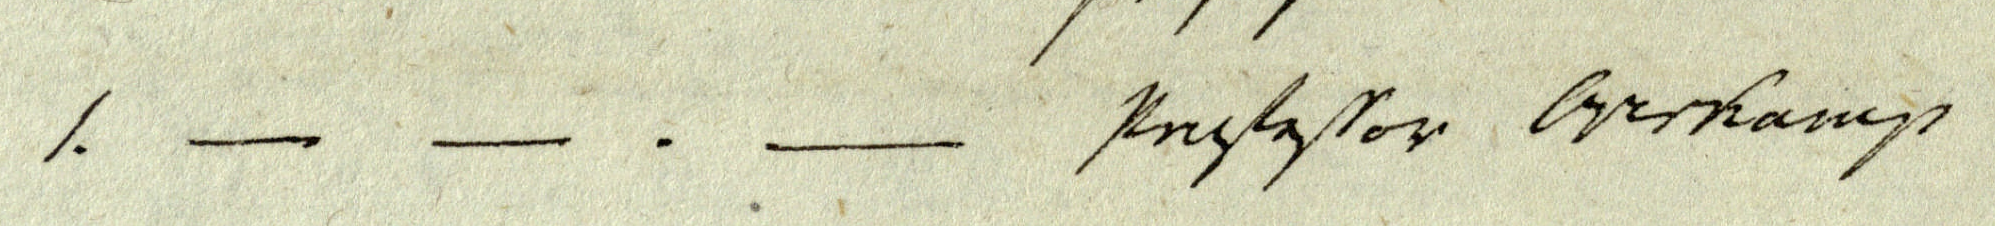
1. Professor Overkamp
